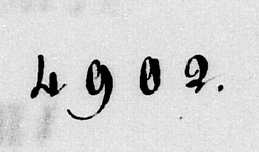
4902.
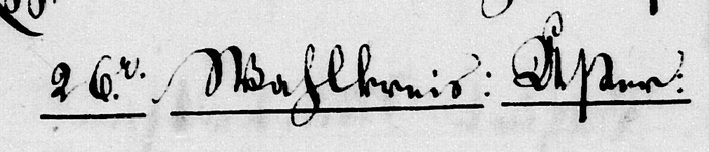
26.r Wahlkreis: Uster:
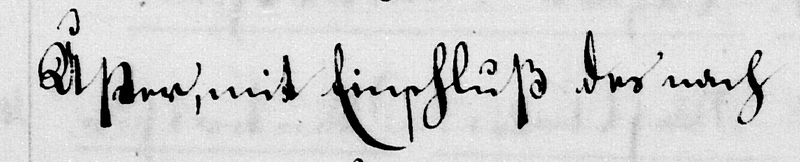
Uster, mit Einschluß des nach
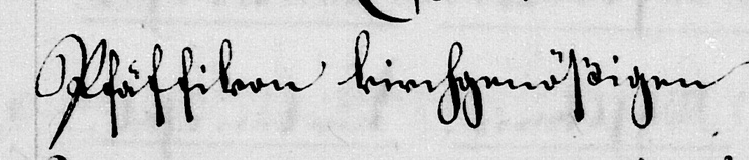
Pfäffikon kirchgenößigen
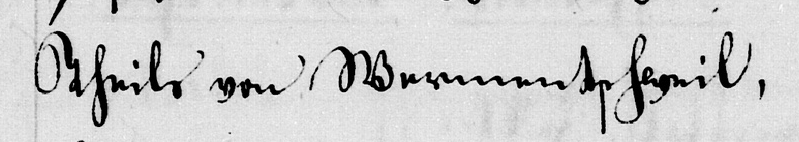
Theils von Wermentschweil,
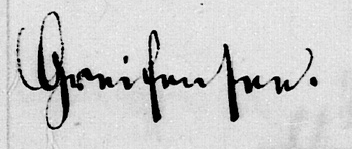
Greifensee.
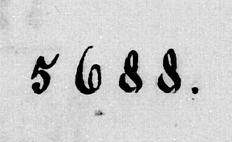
5688.
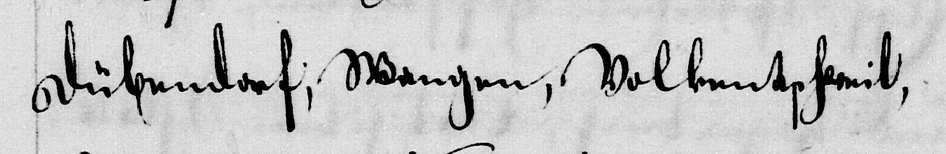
Dübendorf, Wangen, Volkentschweil,
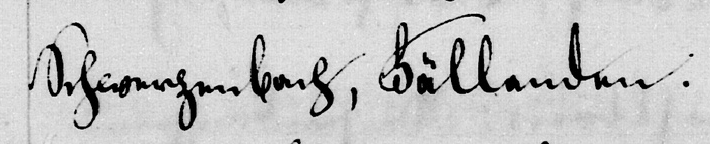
Schwerzenbach, Fällanden.
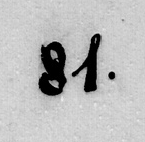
81.
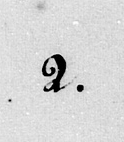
2.
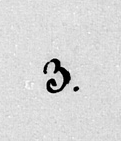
3.
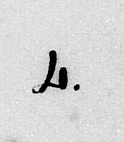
4.
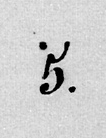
5.
